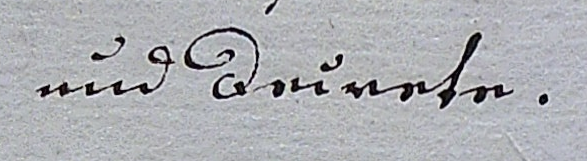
und Decrete.
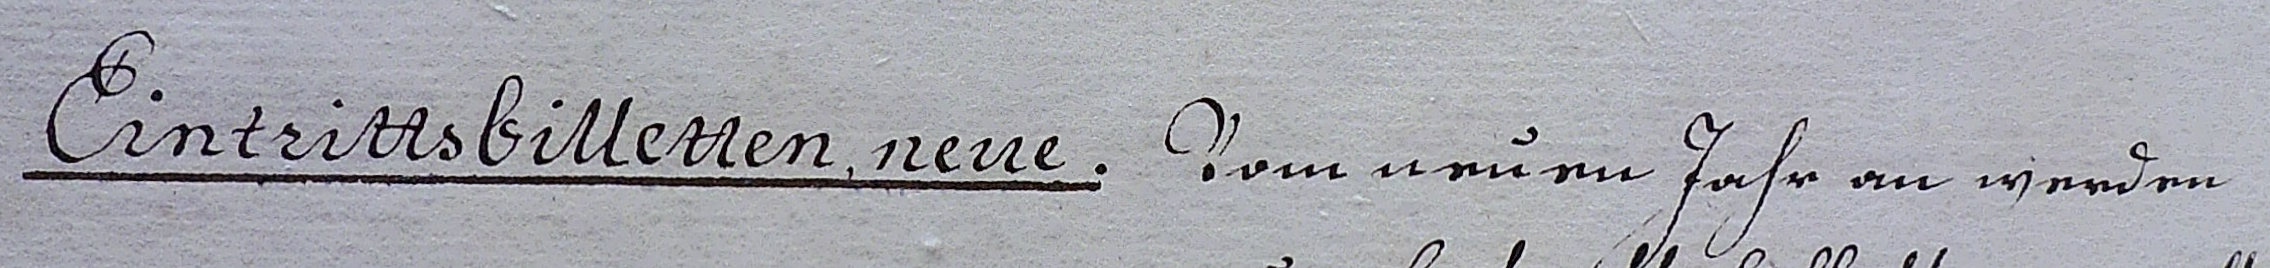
Eintrittsbilletten, neue. Vom neuen Jahr an werden
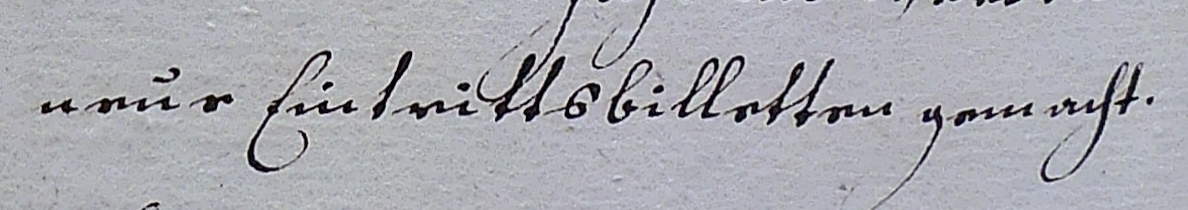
neue Eintrittsbilletten gemacht.
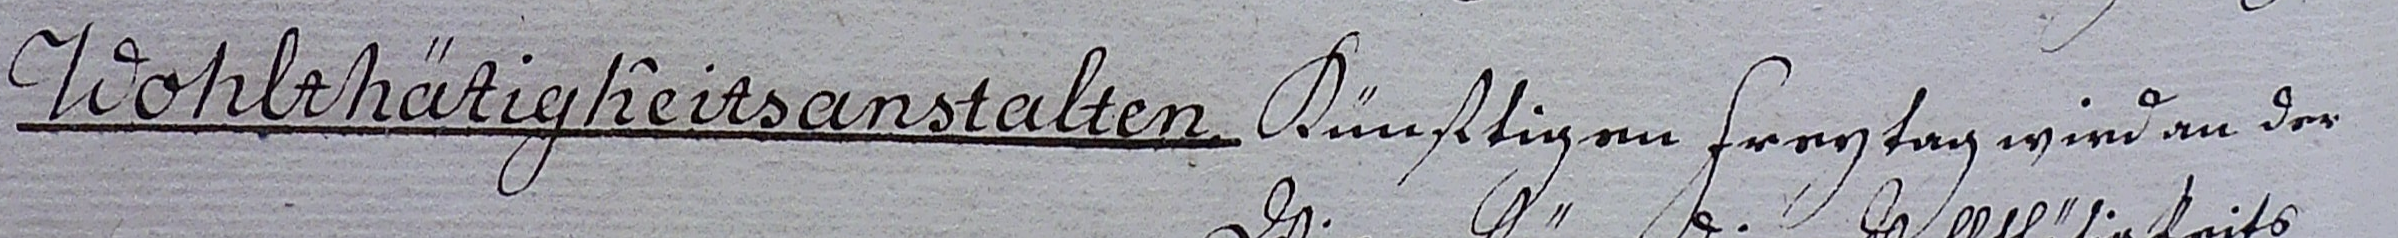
Wohlthätigkeitsanstalten. Künftigen Freytag wird an der
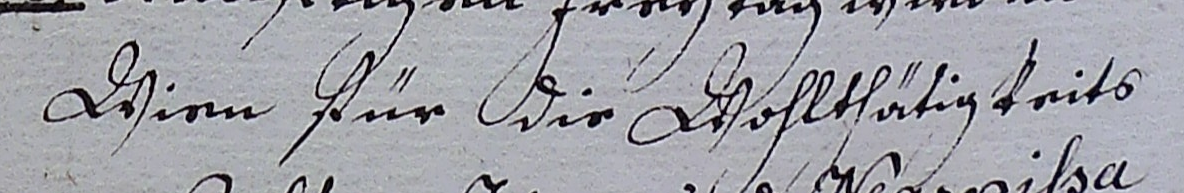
Wien für die Wohlthätigkeits
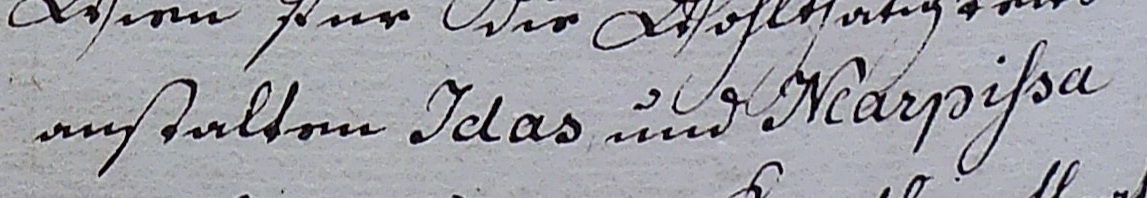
anstalten Idas ud Marpissa
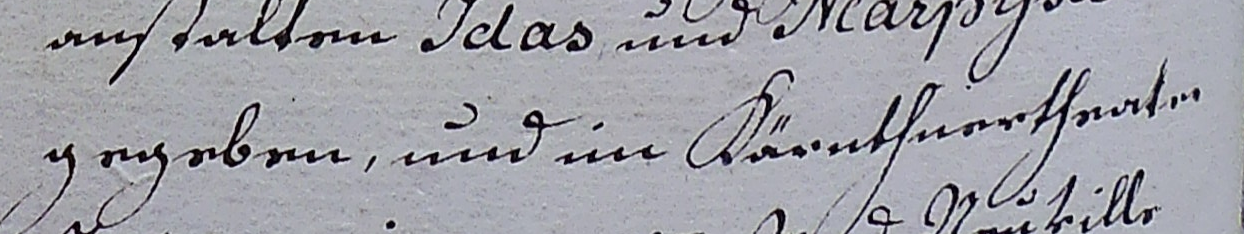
gegeben, und im Kärnthnertheate
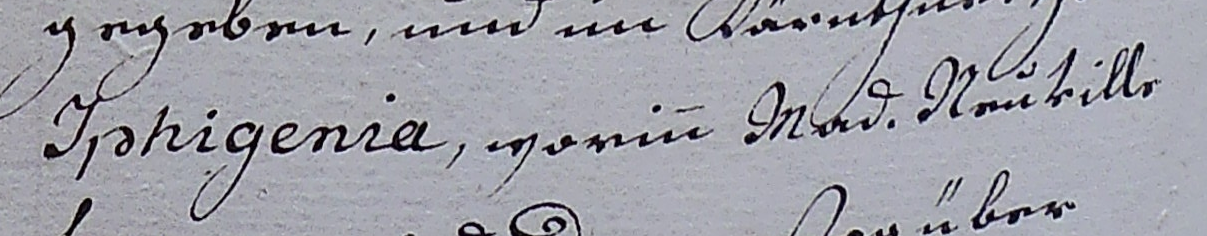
Iphigenia, worin̅ Mad. Neuville
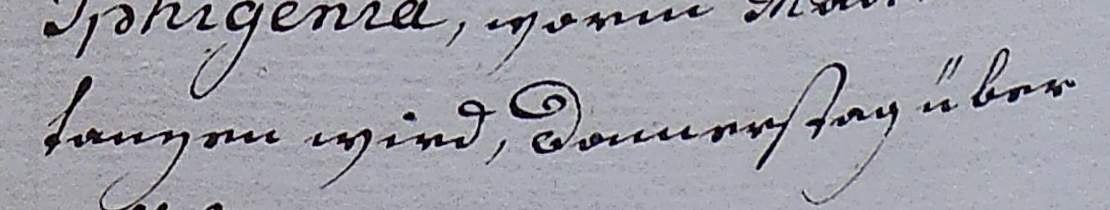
tanzen wird, Donnerstag über
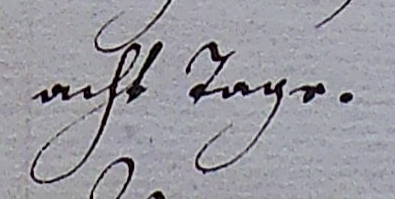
acht Tage.
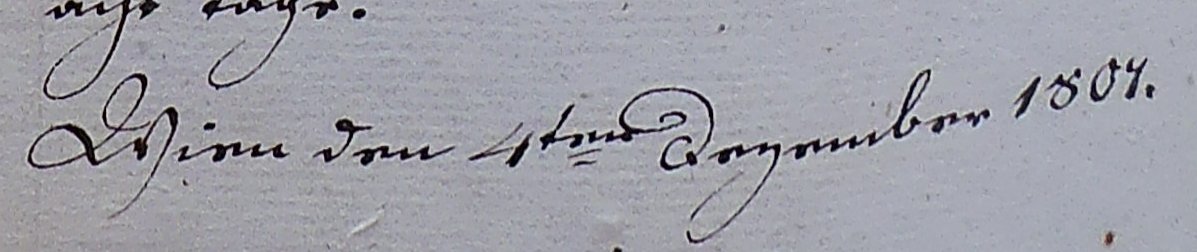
Wien den 4te͇n Dezember 1807.
